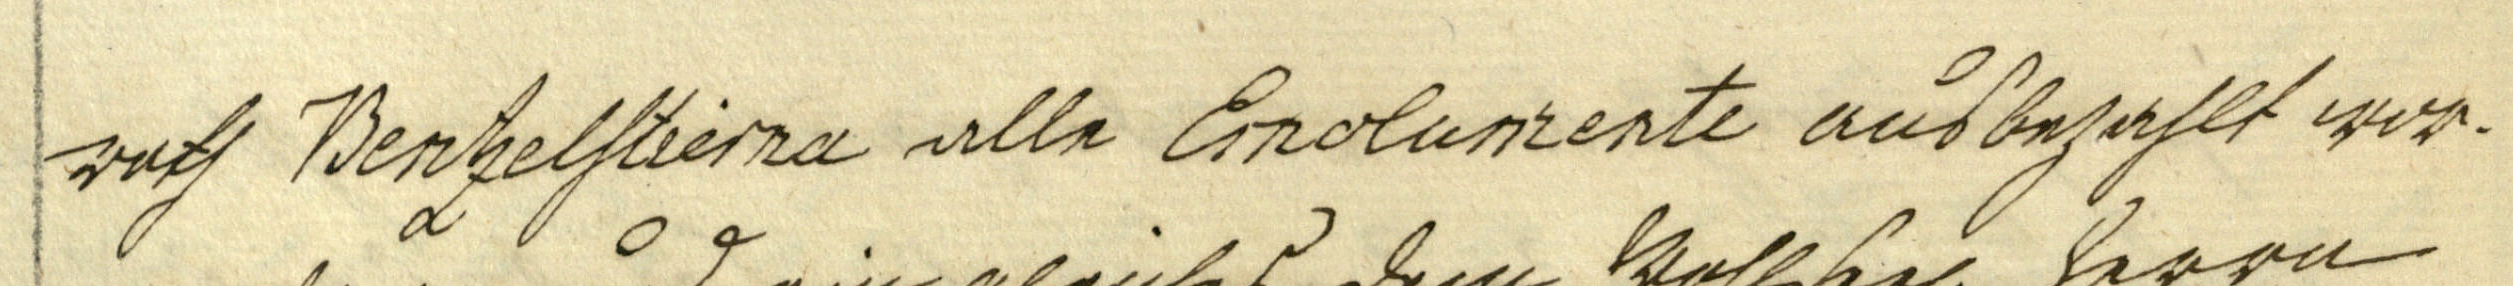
rath Bentzelstierna alle Emolumente aus bezahlt wor¬
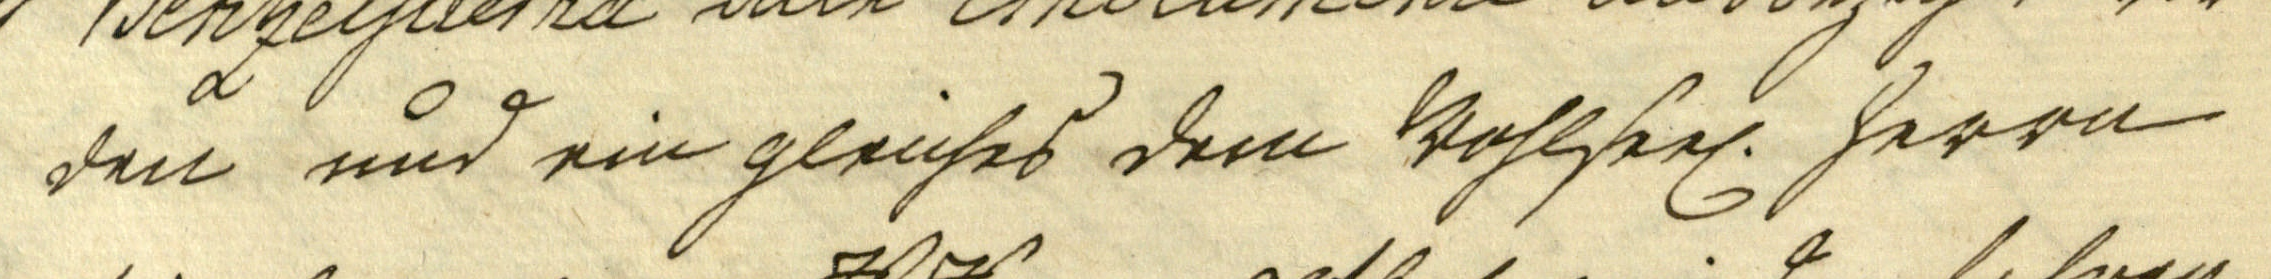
den und ein gleiches dem Wohlseel. Herrn
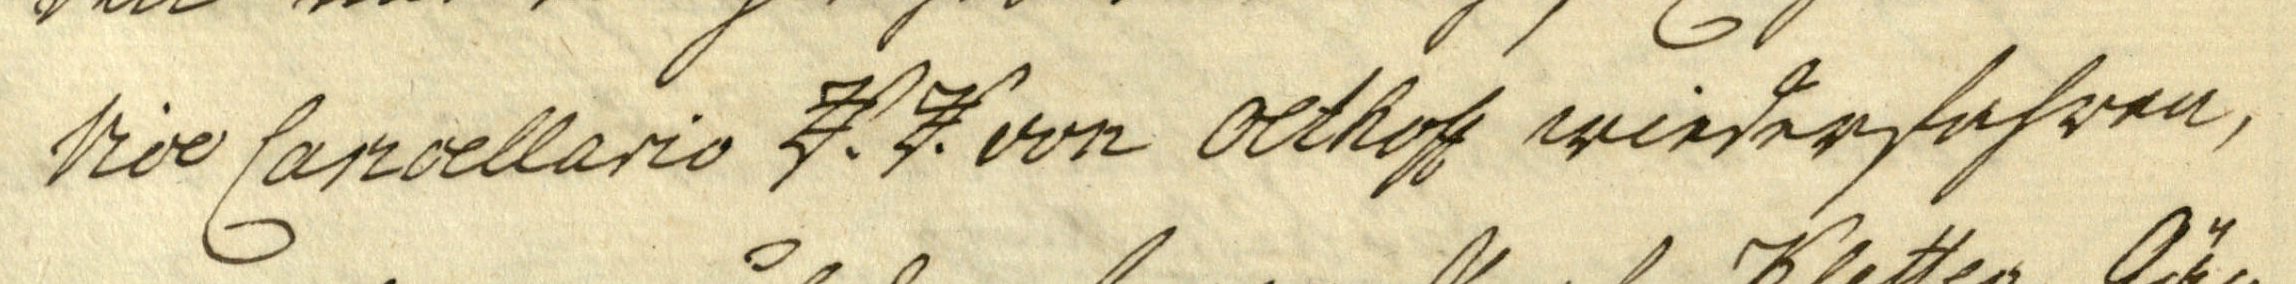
Vice Cancellario R. R von Olthoff wiederfahren,
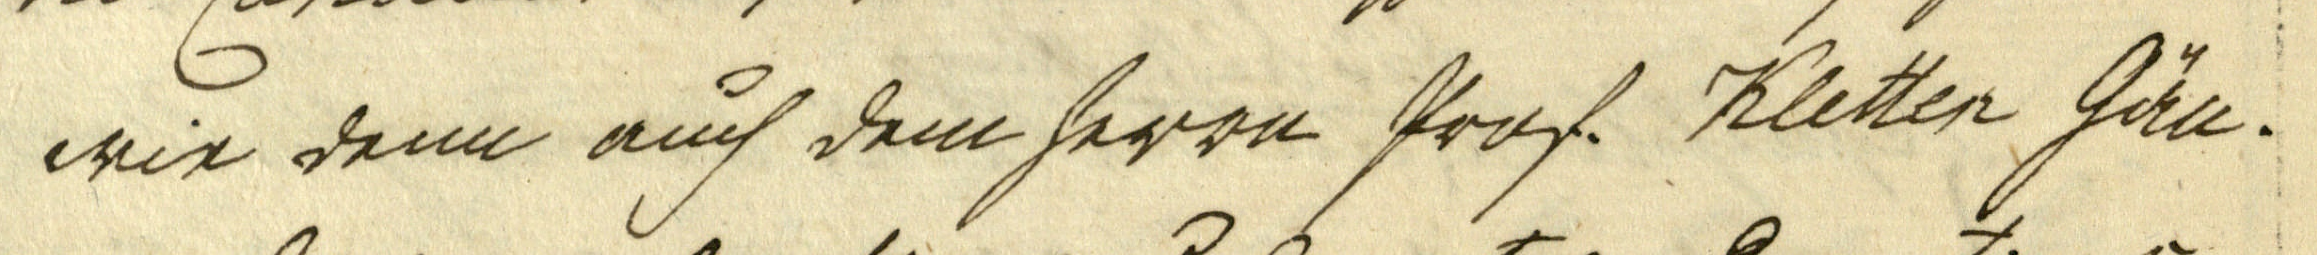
wie denn auch dem Herrn Prof. Kletten Gän-
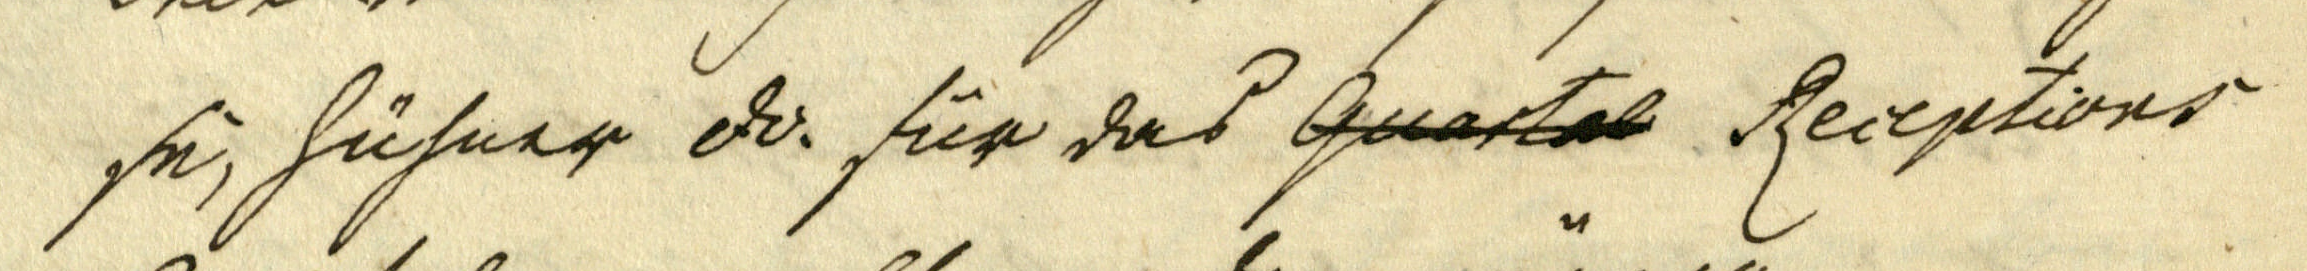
se, Hühner etc. für das Quartal Receptions
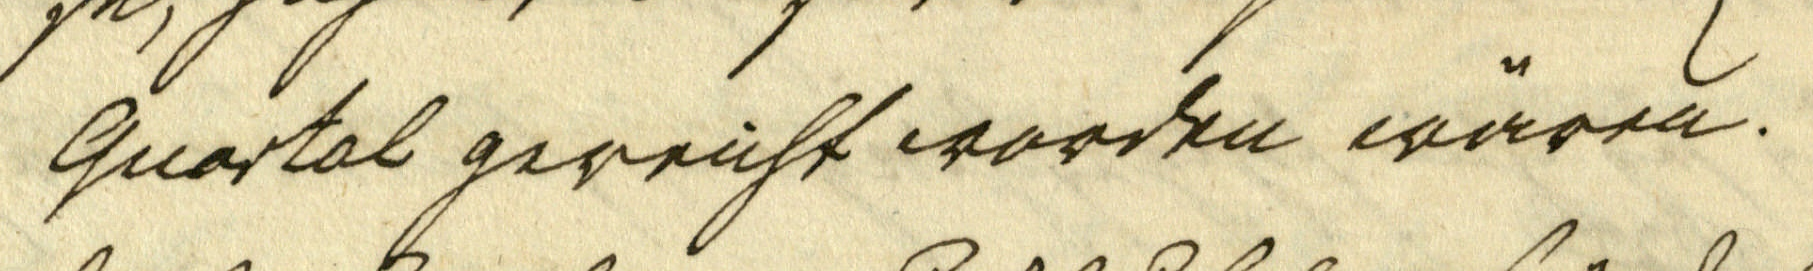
Quartal gereicht worden wären.
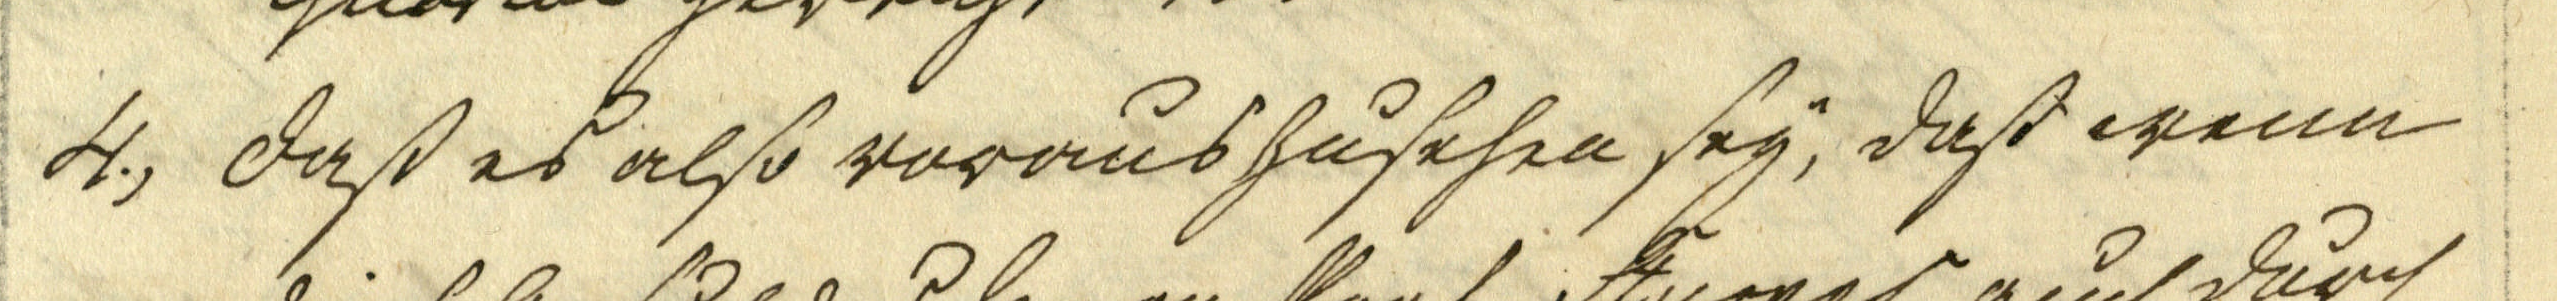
4., Daß es also vorauszusehen seÿ, daß wenn
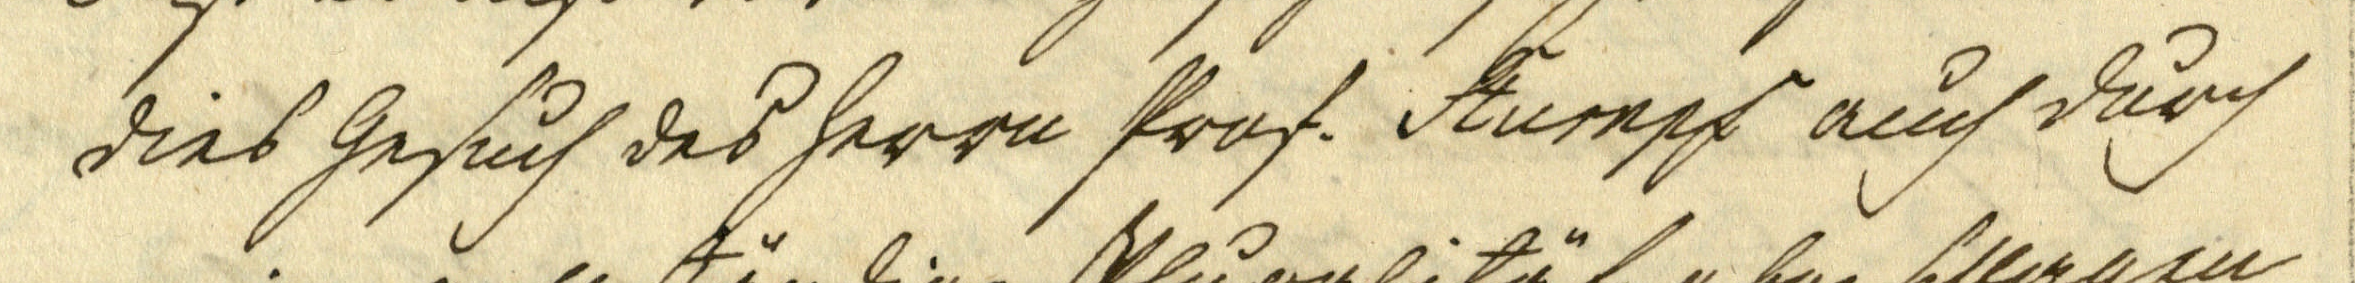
dies Gesuch des Herrn Prof. Stumpf auch durch
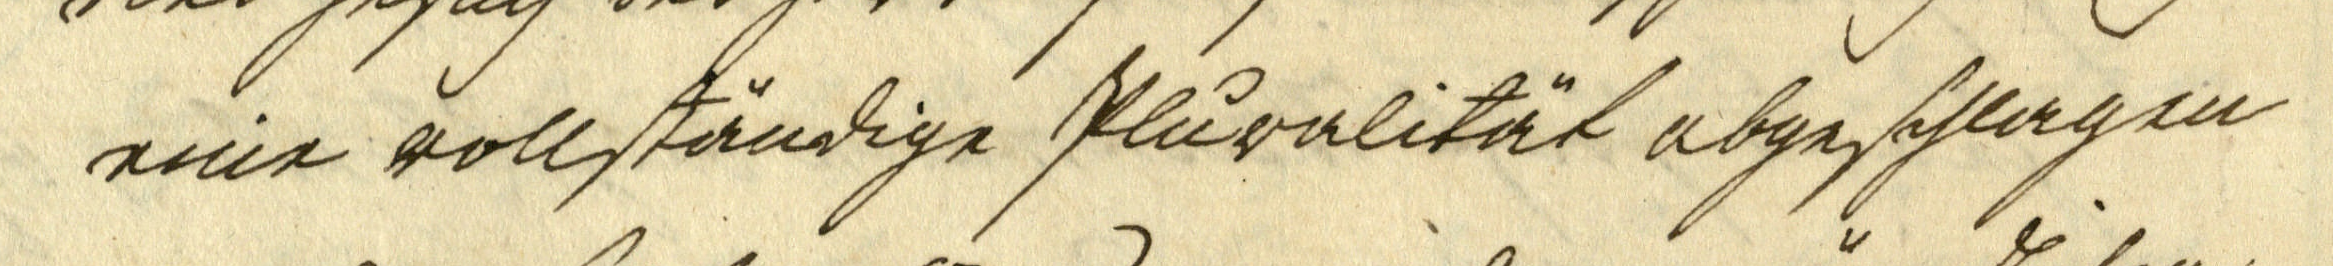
eine vollständige Pluralität abgeschlagen
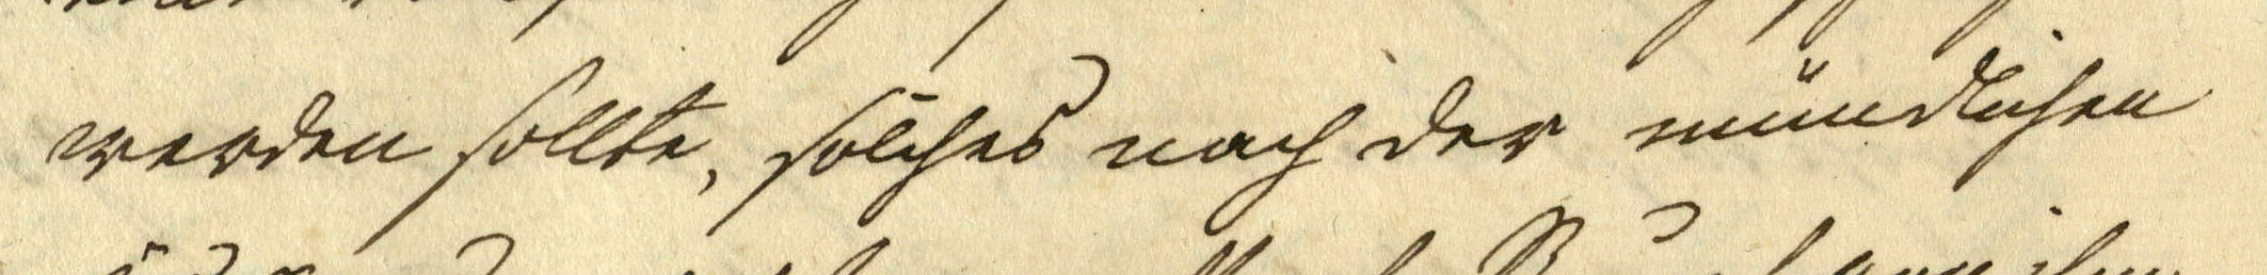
werden sollte, solches nach der mündlichen
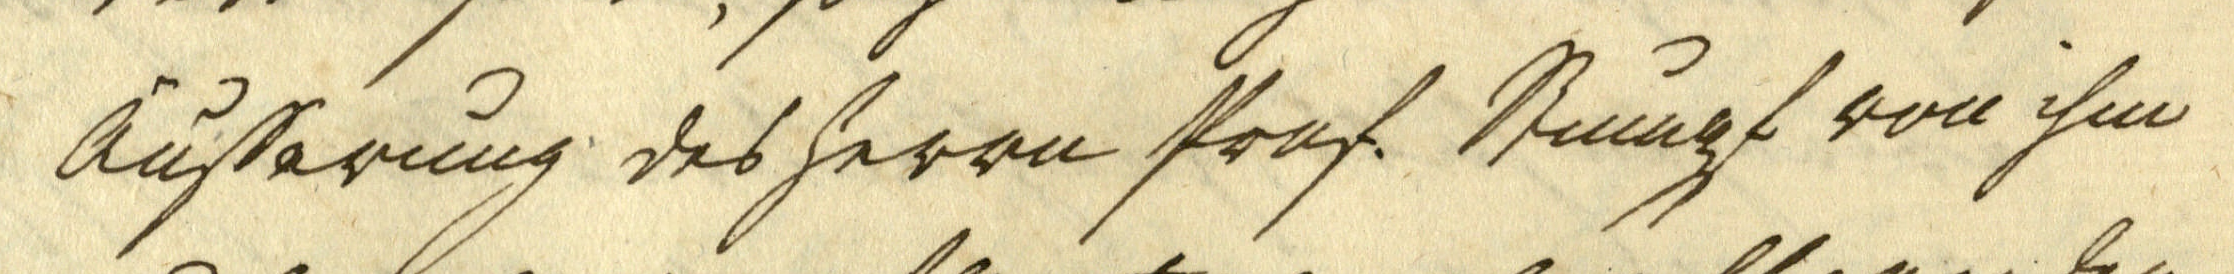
Äusserung des Herrn Prof. Stumpf von ihm
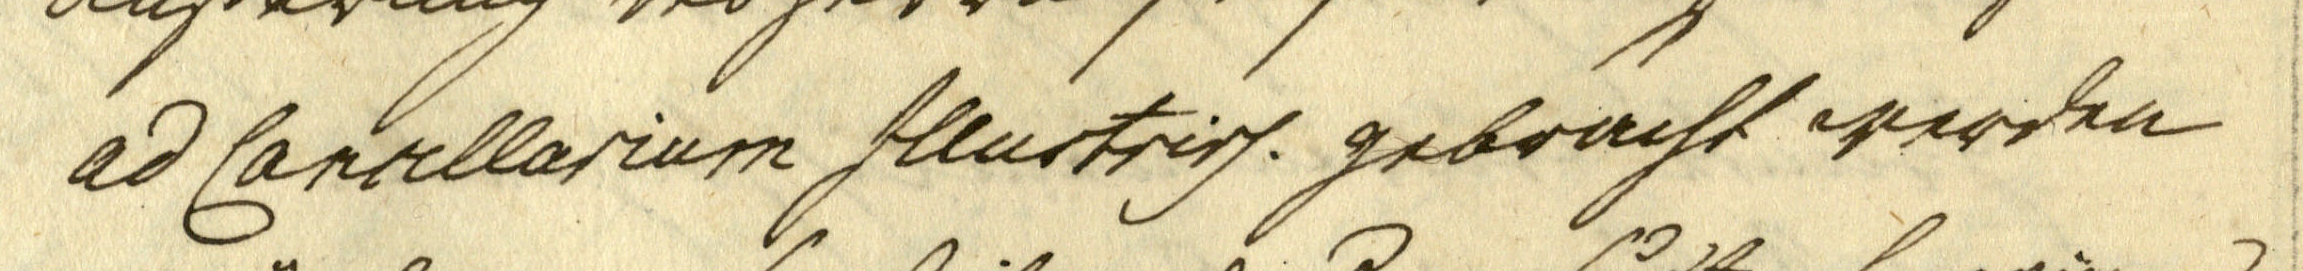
ad Cancellarium Illustriss. gebracht werden
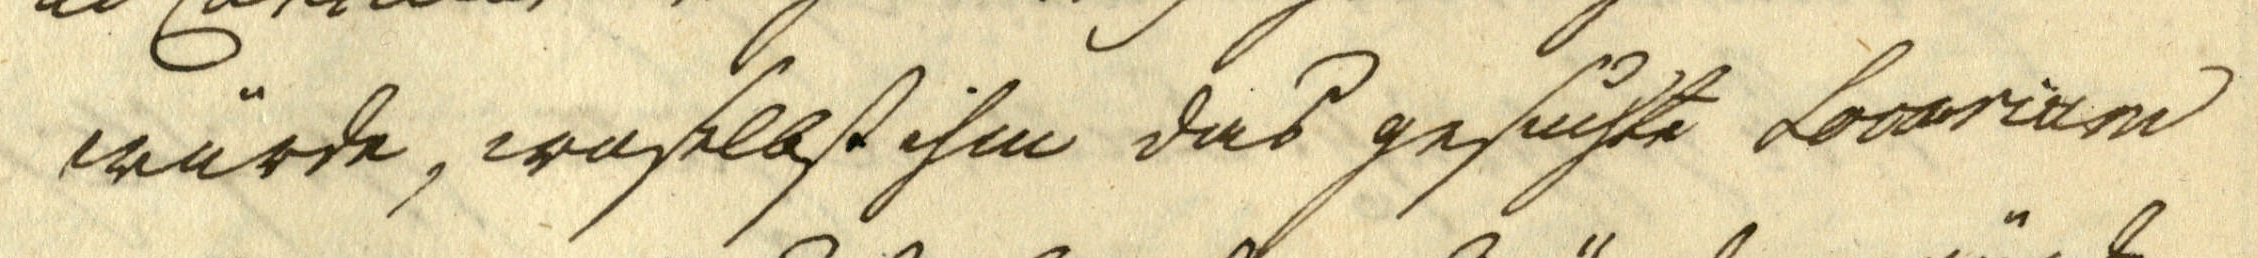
würde, woselbst ihm das gesuchte Locarium
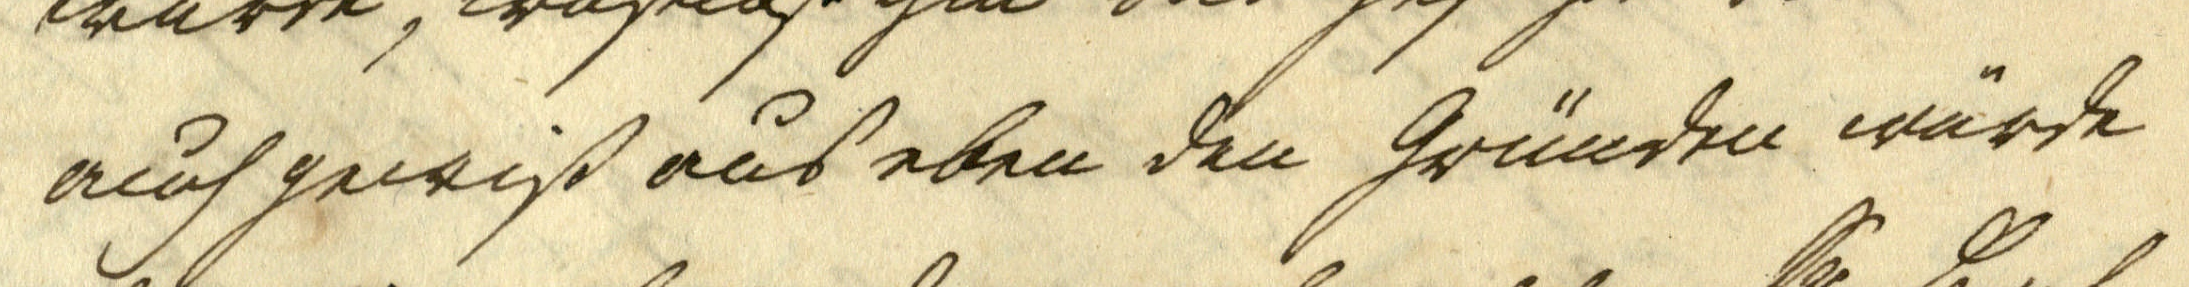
auch gewiß aus eben den Gründen würde
